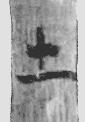十一
